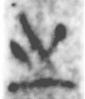之
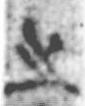之
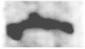一
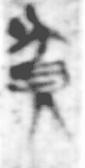貧（紛）
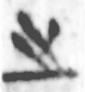之
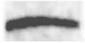一
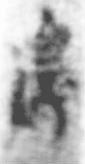○（翠）
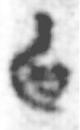首
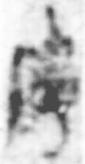○（翠）
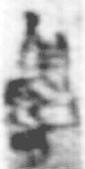頸
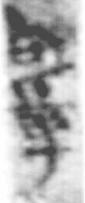○（緅）
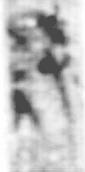敗
